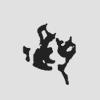𡄹
